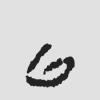㠯（以）
